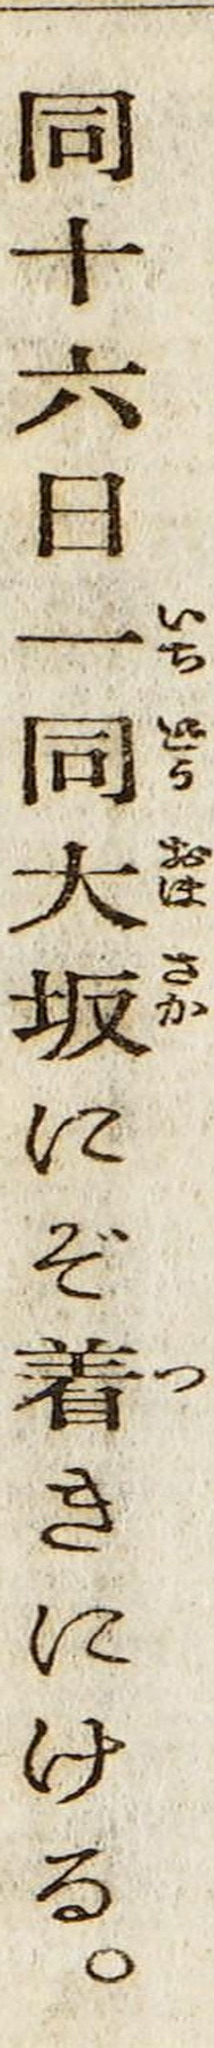同十六日一同大坂にぞ着きにける。
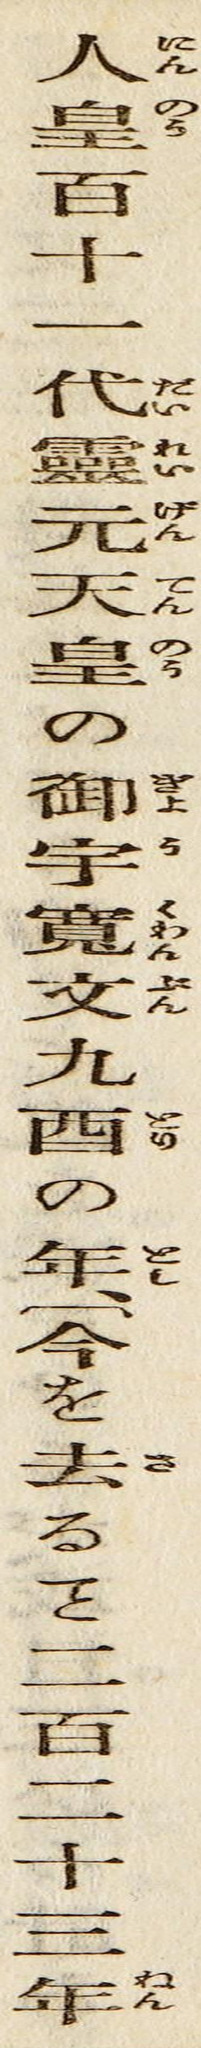人皇百十一代霊元天皇の御宇寛文九酉の年、[今を去ること二百二十三年
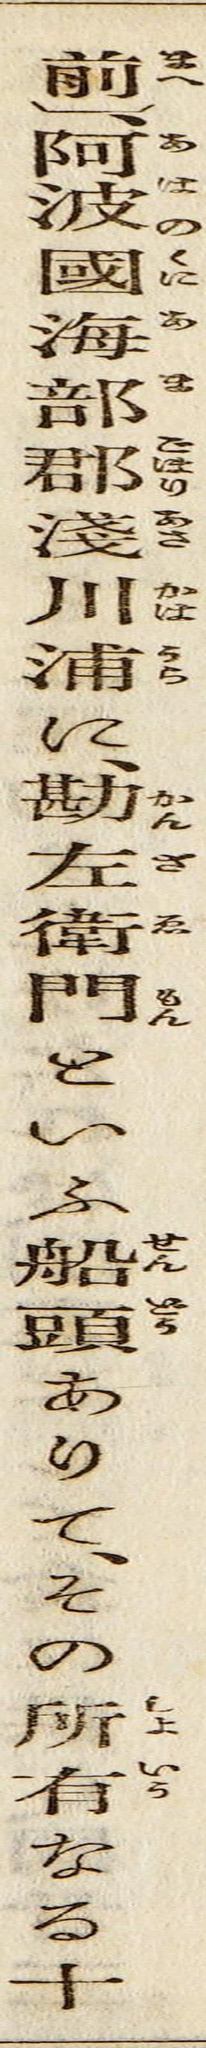前]、阿波国海部郡浅川浦に、勘左衛門といふ船頭ありて、その所有なる十
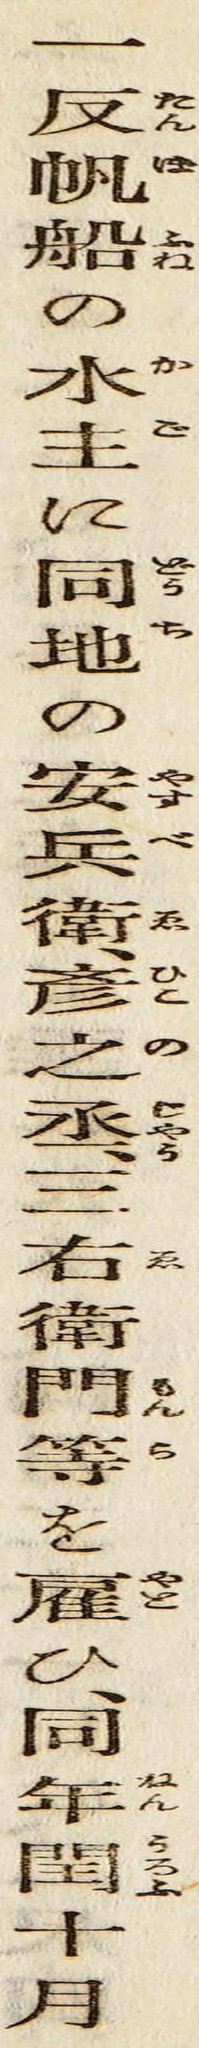一反帆船の水主に同地の安兵衛、彦之丞、三右衛門等を雇ひ、同年閏十月
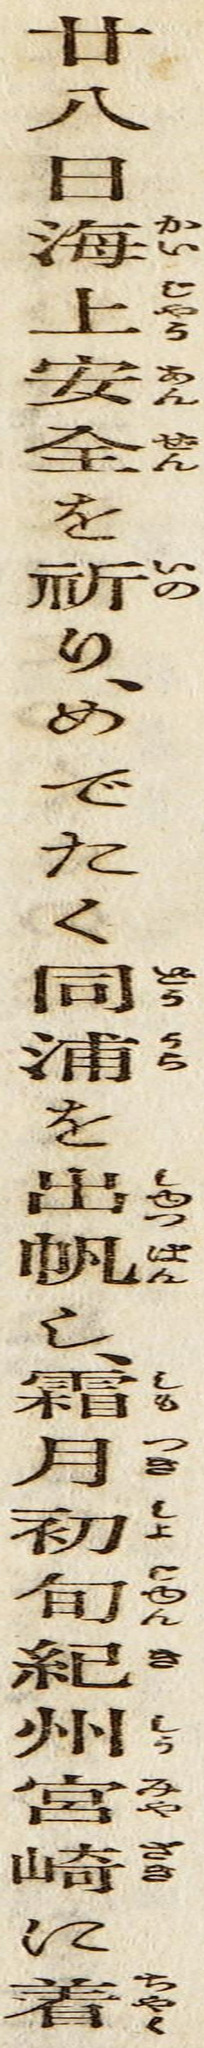廿八日海上安全を祈り、めでたく同浦を出帆し、霜月初旬紀州宮崎に着
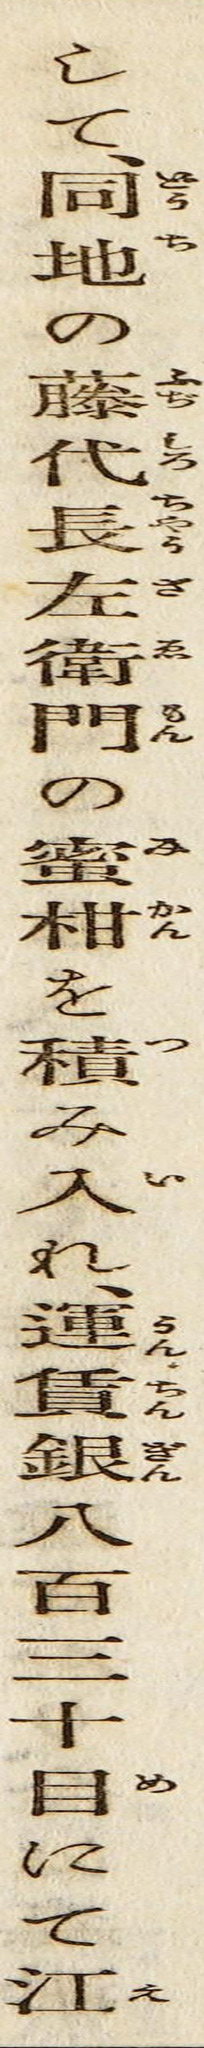して、同地の藤代長左衛門の蜜柑を積み入れ、運賃銀八百三十目にて江
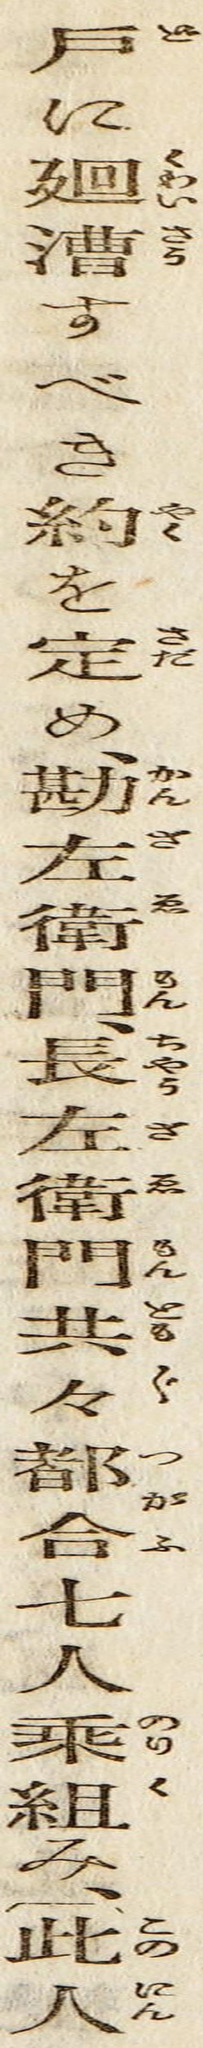戸に廻漕すべき約を定め、勘左衛門、長左衛門共々都合七人乗組み、[此人
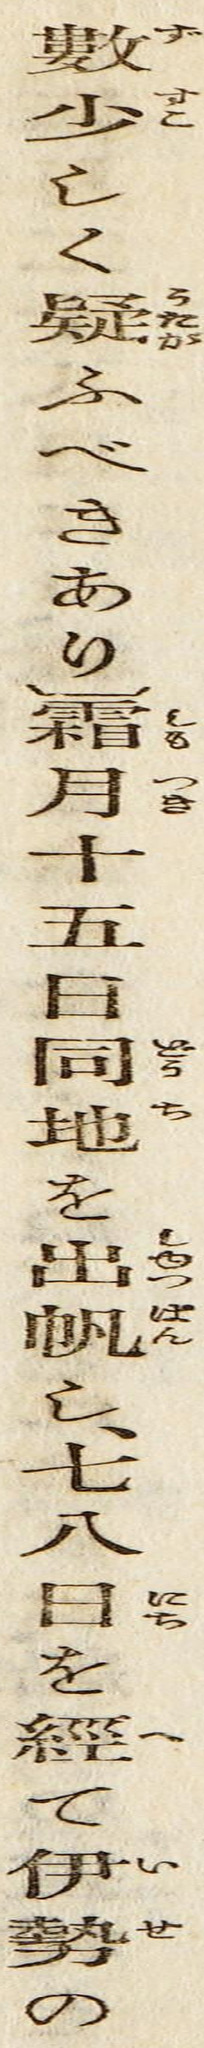数少しく疑ふべきあり]霜月十五日同地を出帆し、七八日を経て伊勢の
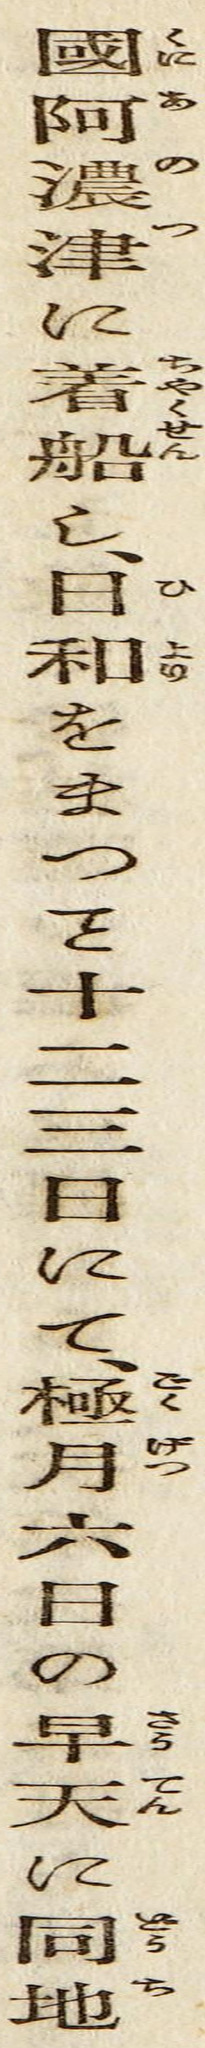国阿濃津に着船し、日和をまつこと十二三日にて、極月六日の早天に同地
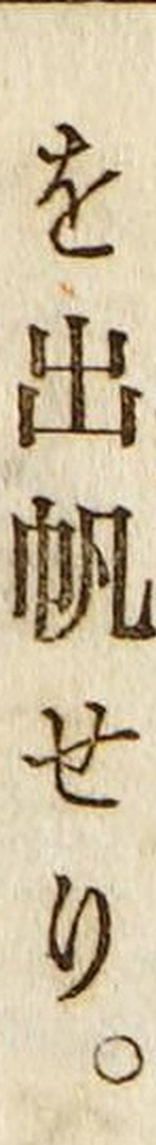を出帆せり。
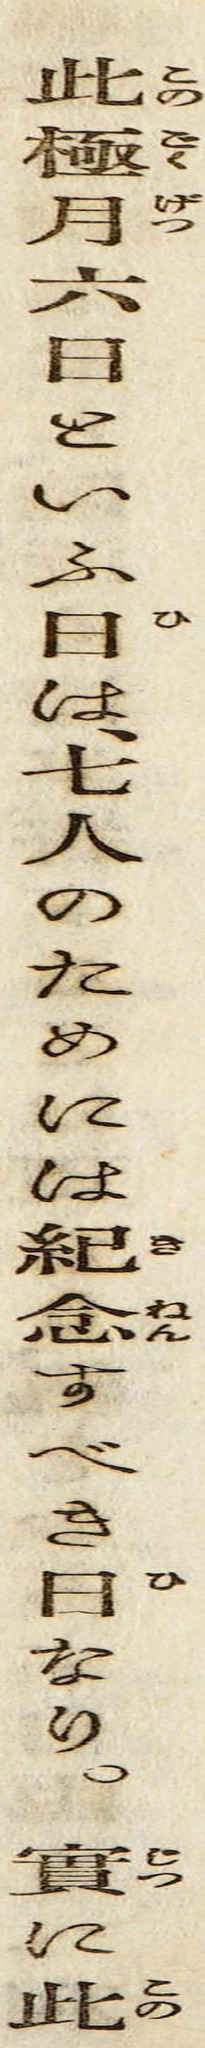此極月六日といふ日は、七人のためには紀念すべき日なり。実に此
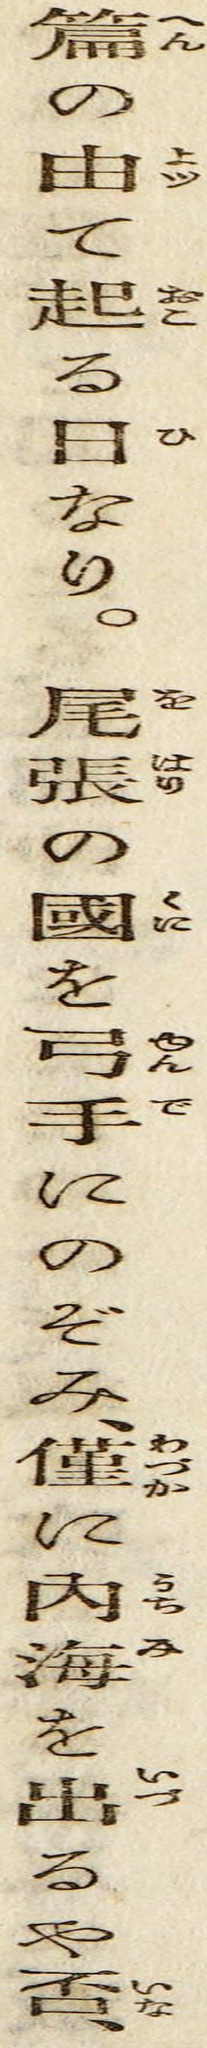篇の由て起る日なり。尾張の国を弓手にのぞみ、僅に内海を出るや否、

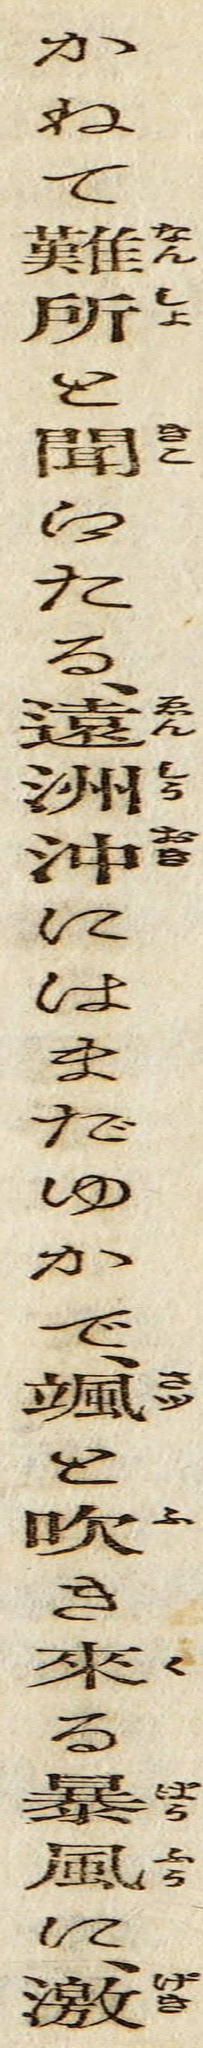かねて難所と聞えたる、遠州沖にはまだゆかで、颯と吹き来る暴風に、激
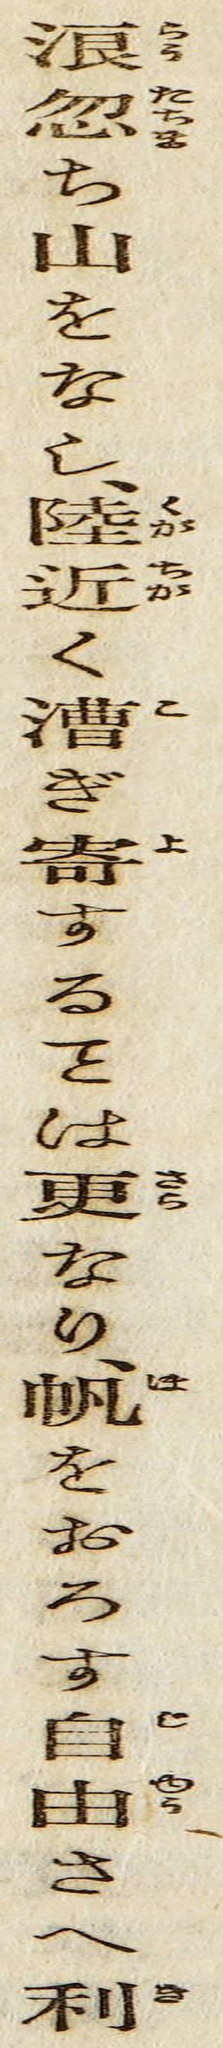浪忽ち山をなし、陸近く漕ぎ寄することは更なり、帆をおろす自由さへ利
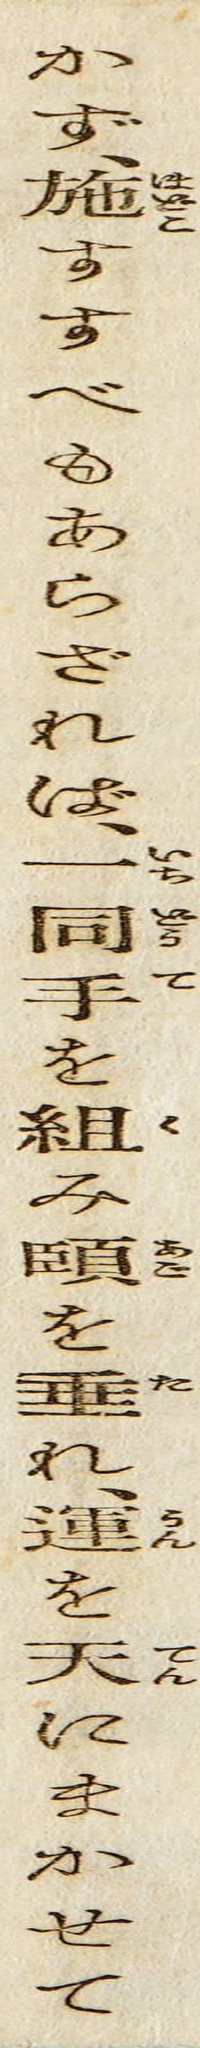かず、施すすべもあらざれば、一同手を組み頣を垂れ、運を天にまかせて
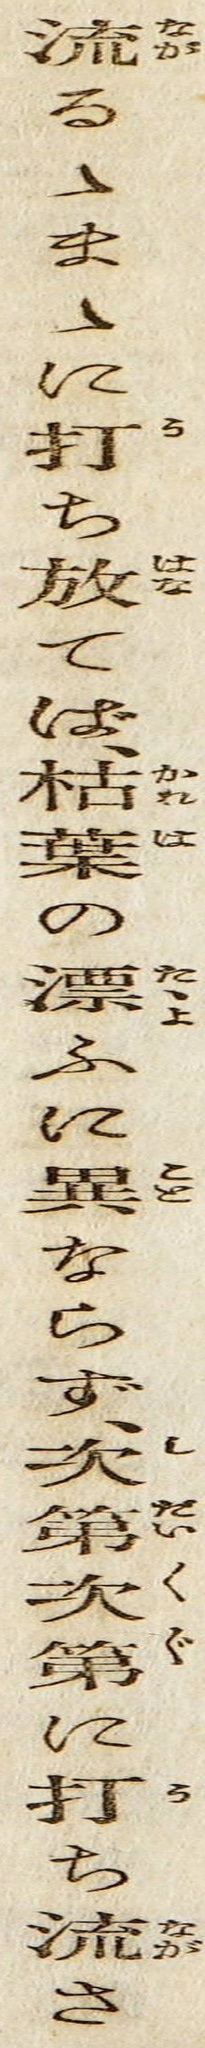流るゝまゝに打ち放てば、枯葉の漂ふに異ならず、次第次第に打ち流さ
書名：日本漂流譚
